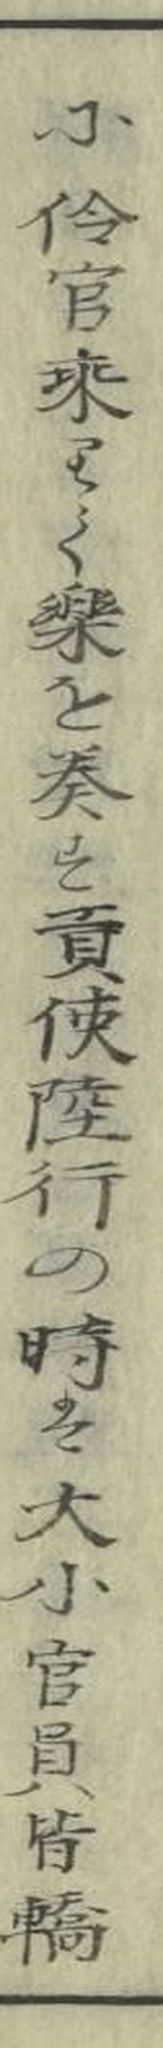に伶官乗りて楽を奏す貢使陸行の時は大小官員皆轎
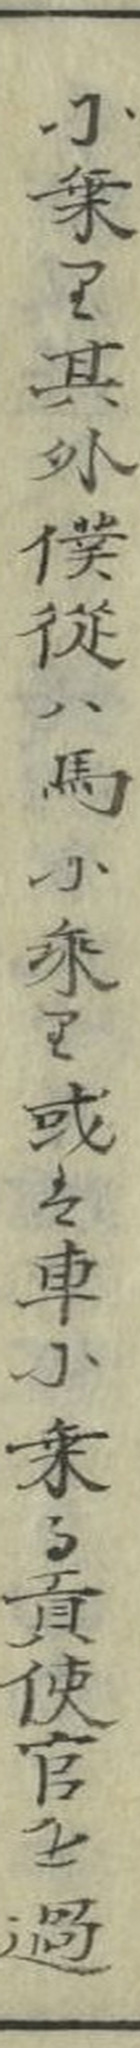に乗り其外僕従は馬に乗り或は車に乗る貢使官を過
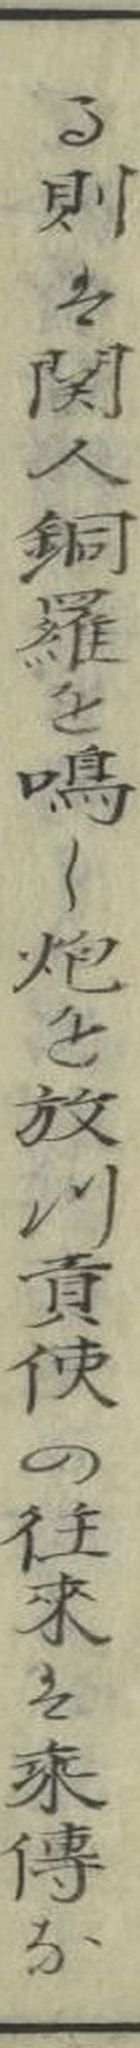る則は関人銅羅を鳴し炮を放つ貢使の往来は乗伝な

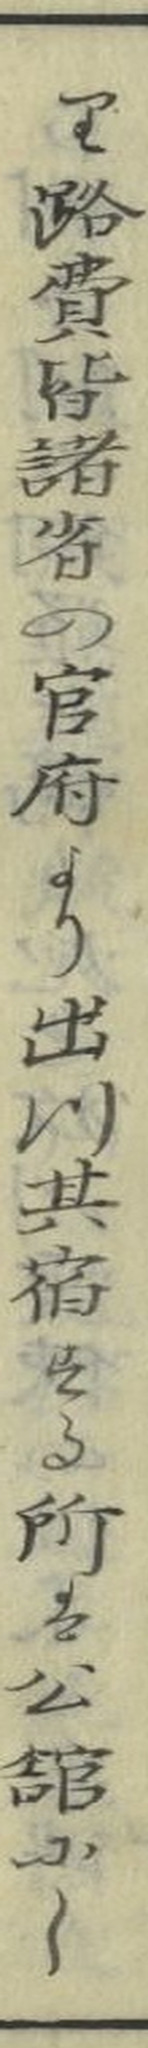り路費皆諸省の官府より出つ其宿する所は公館にし
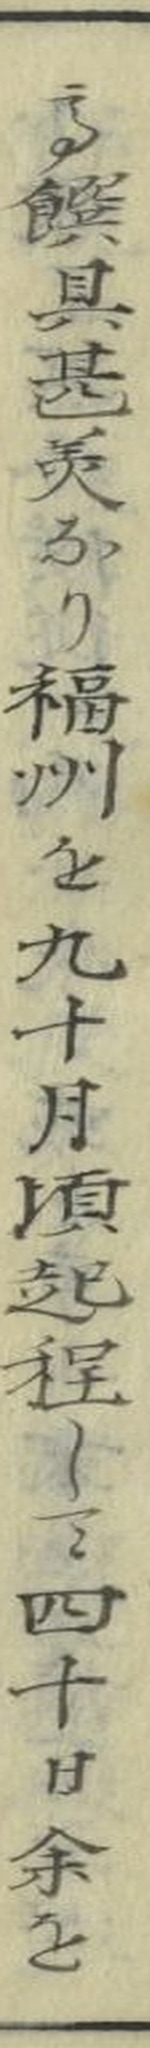て饌具甚美なり福州を九十月頃起程して四十日余を
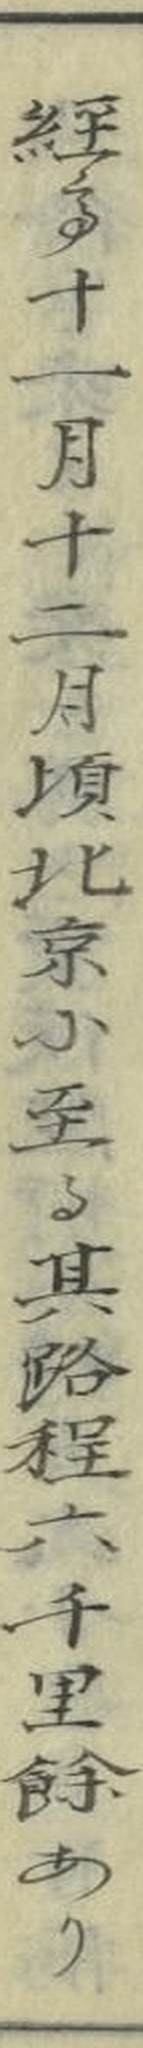経て十一月十二月頃北京に至る其路程六千里餘あり
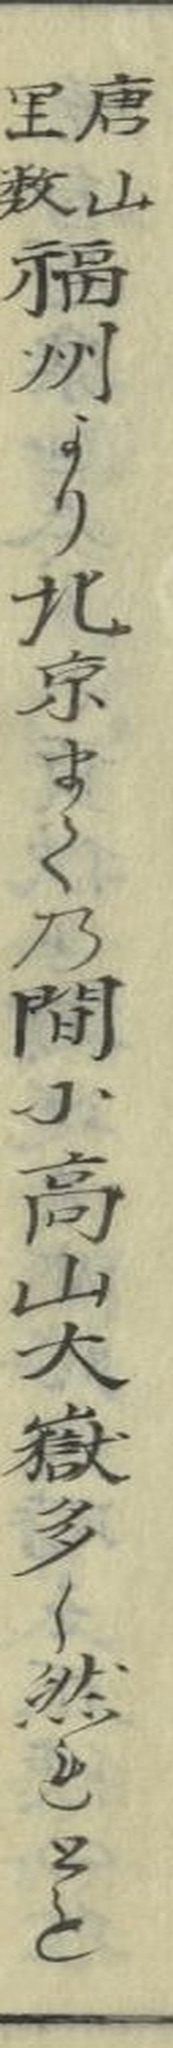唐山里数福州より北京まての間に高山大嶽多し然れとも
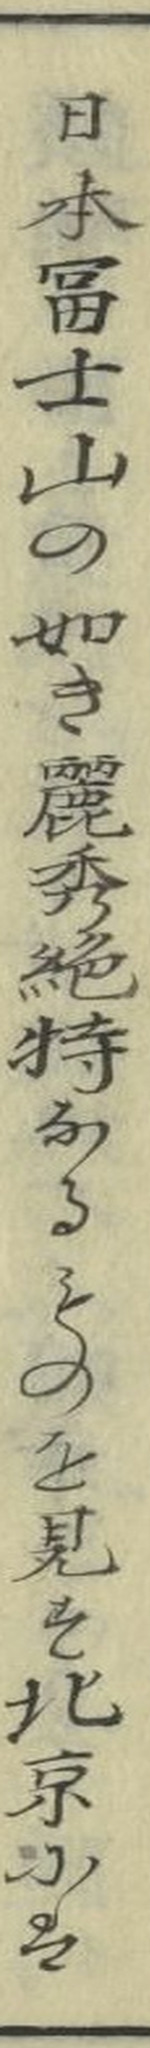日本冨士山の如き麗秀絶特なるものを見す北京には
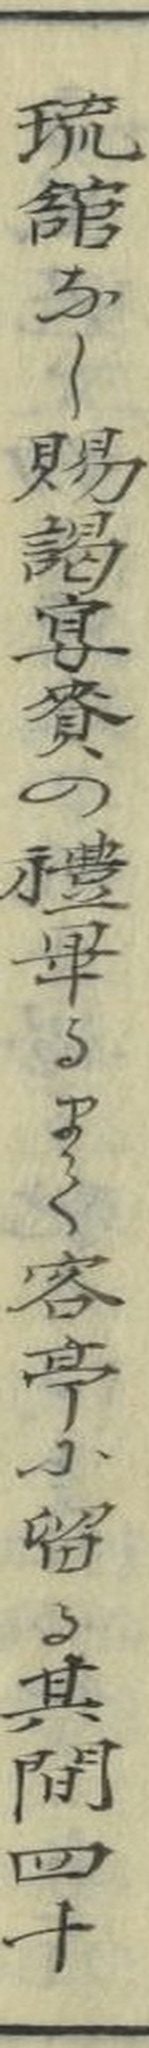琉館なし賜謁宴賚の礼畢るまて客亭に留る其間四十
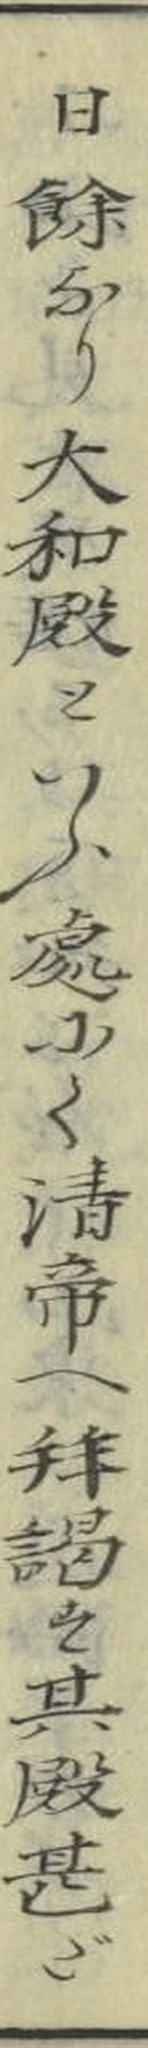日餘なり大和殿といふ処にて清帝へ拝謁す其殿甚だ
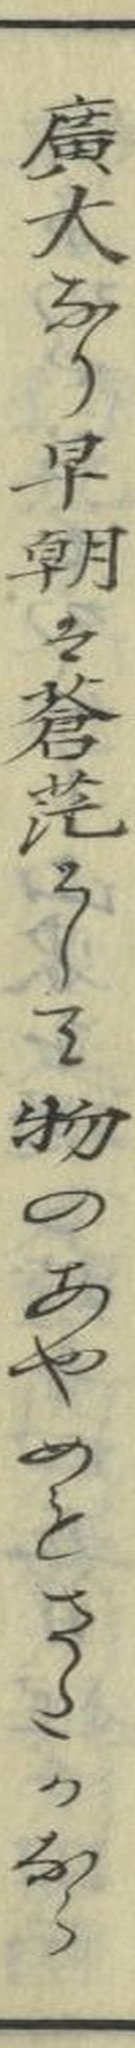広大なり早朝は蒼芒として物のあやめもさたかなら
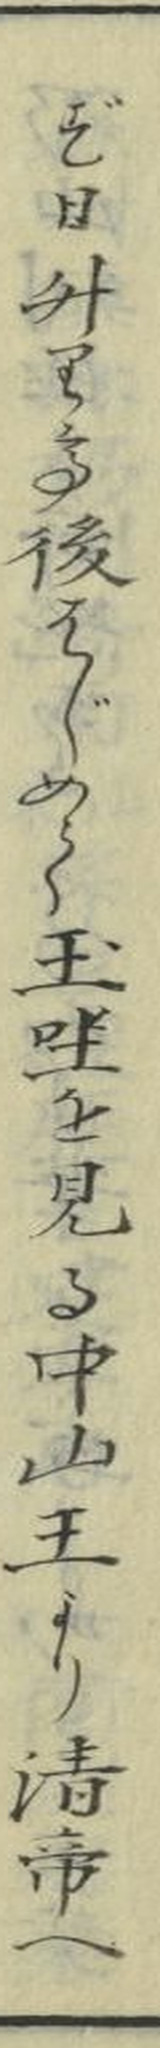ず日升りて後はじめて玉㘴を見る中山王より清帝へ
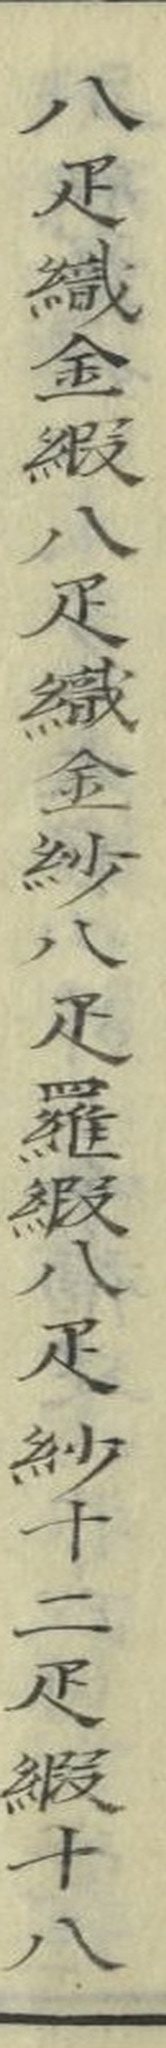八疋織金縀八疋織金紗八疋羅縀八疋紗十二疋縀十八
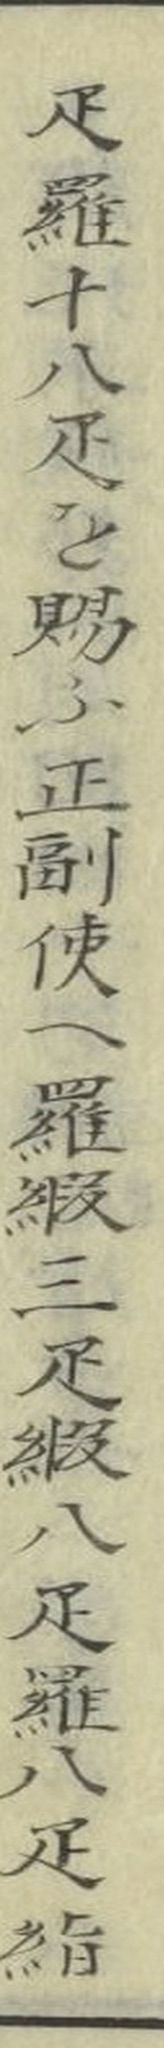疋羅十八疋を賜ふ正副使へ羅縀三疋縀八疋羅八疋
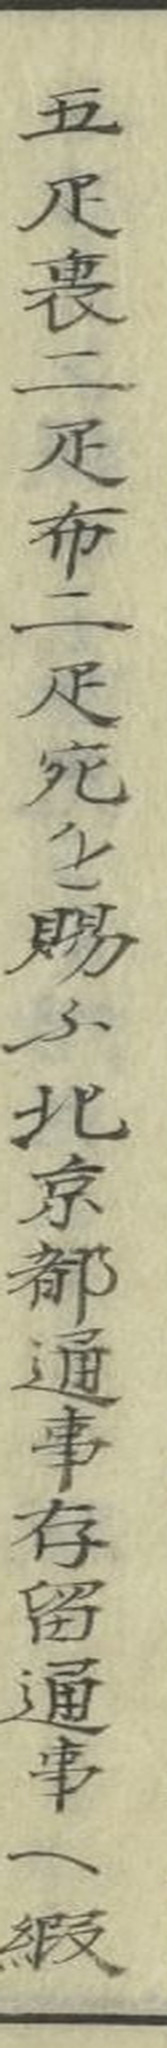五疋裏二疋布二疋宛を賜ふ北京都通事存留通事へ縀
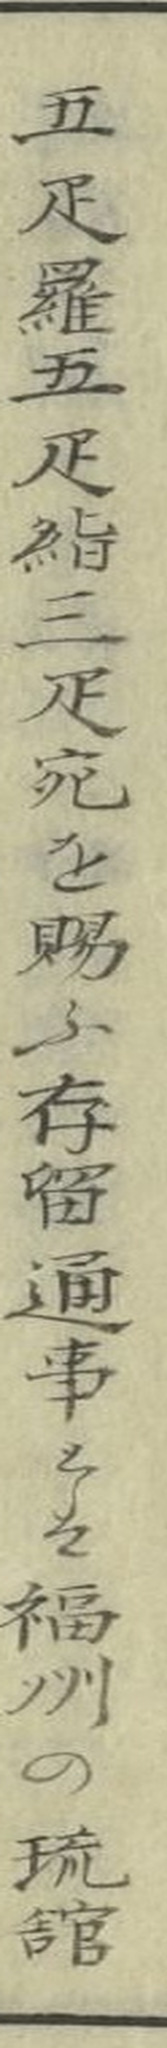五疋羅五疋三疋宛を賜ふ存留通事とは福州の琉館
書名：琉球沿革志 下
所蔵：University of the Ryukyus Library
